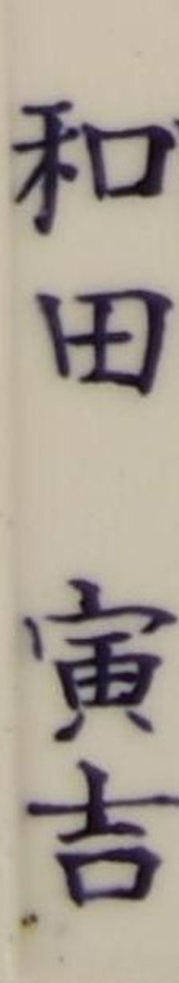和田寅吉

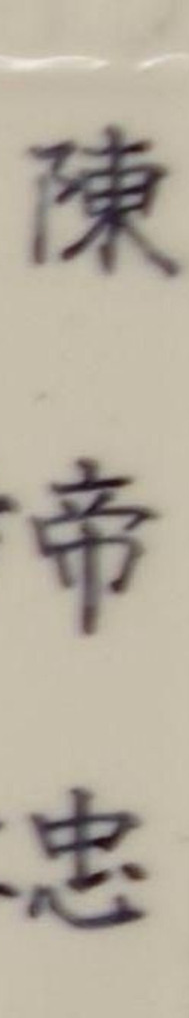陳帝忠
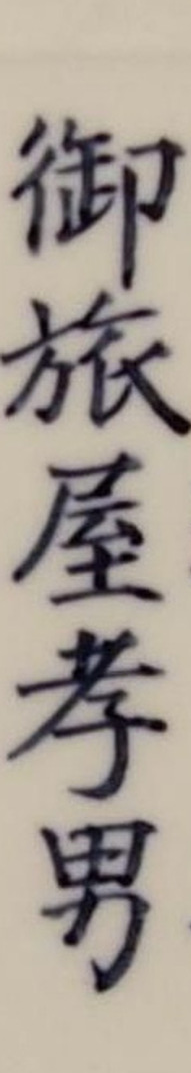御旅屋孝男
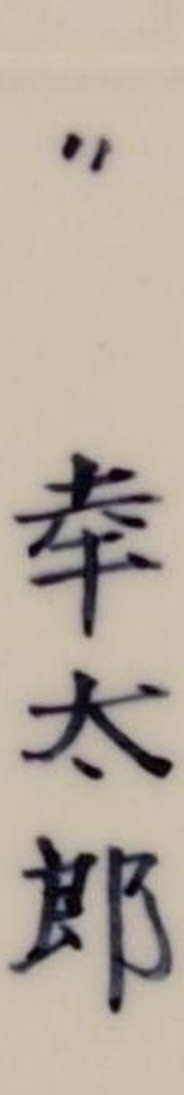幸太郎
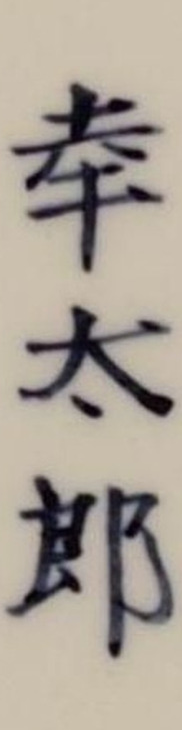幸太郎
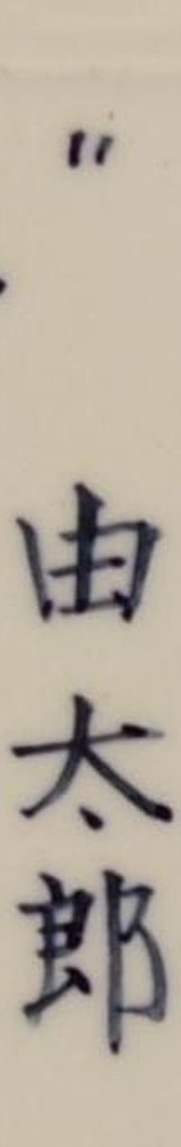由太郎
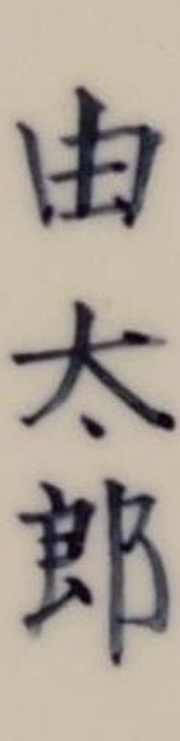由太郎
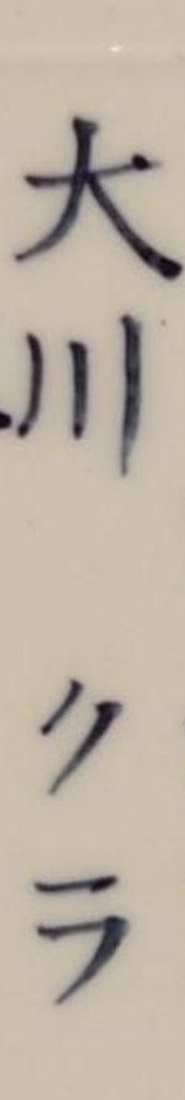大川クラ
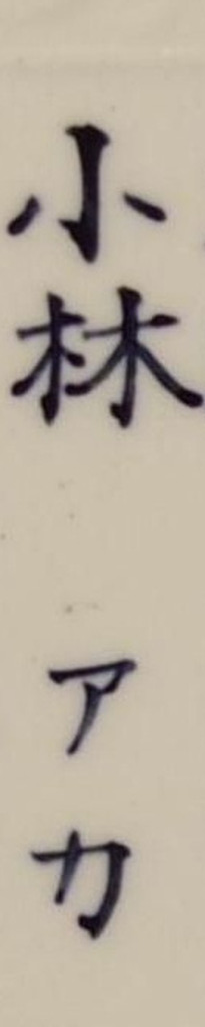小林アカ
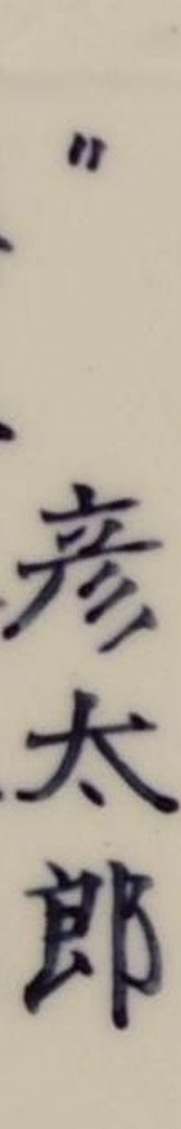彦太郎
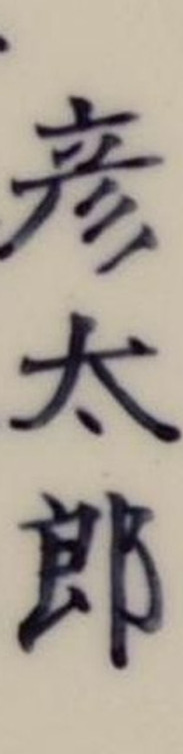彦太郎
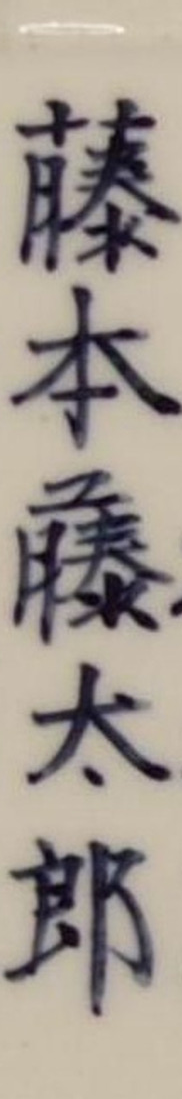藤本藤太郎
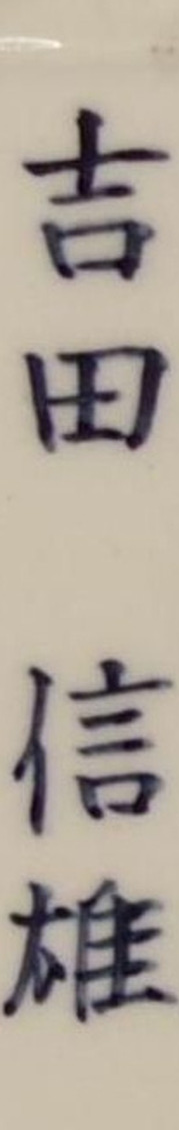吉田信雄
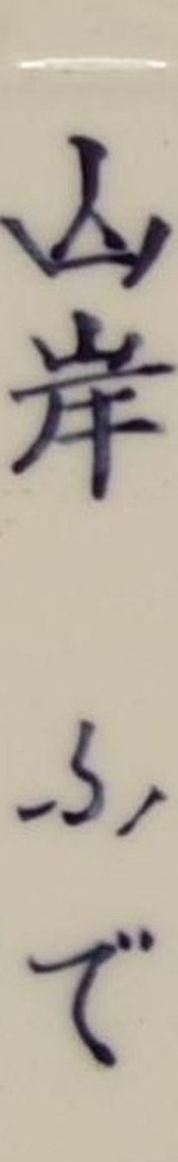山岸ふで

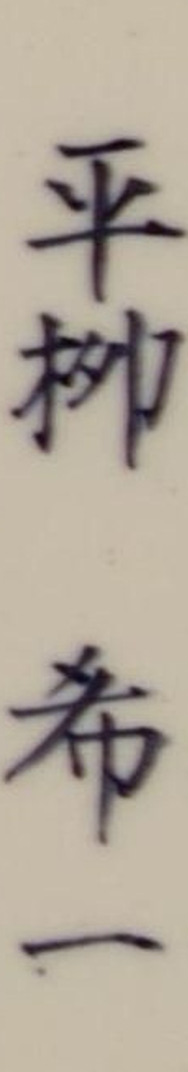平柳希一
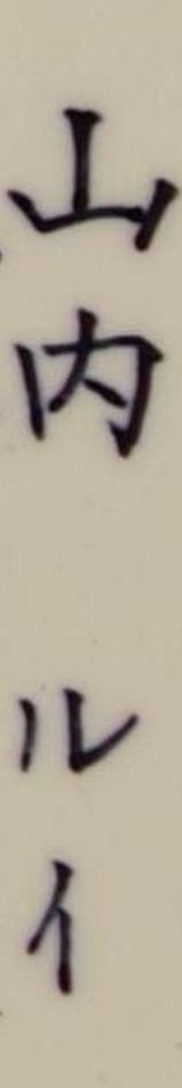山内ルイ
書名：M~S
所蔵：高野山金剛峯寺
